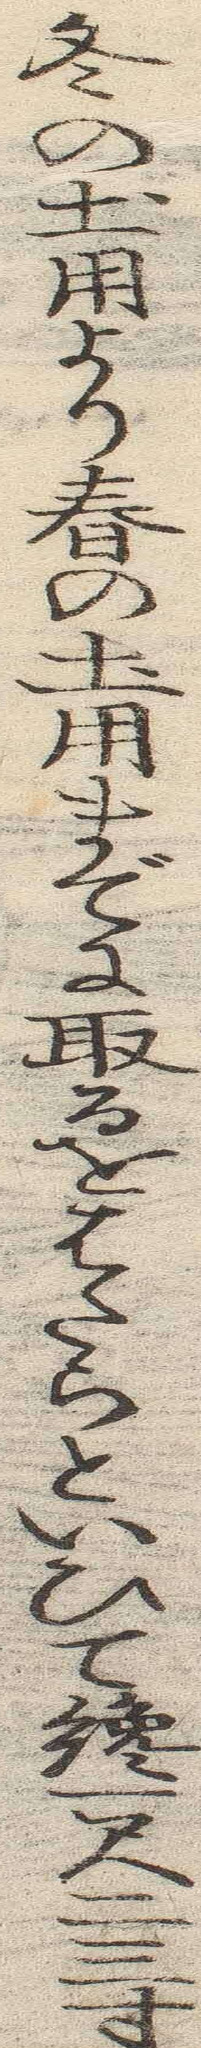冬の土用より春の土用までに取るをはたらといひて纔一尺二三寸
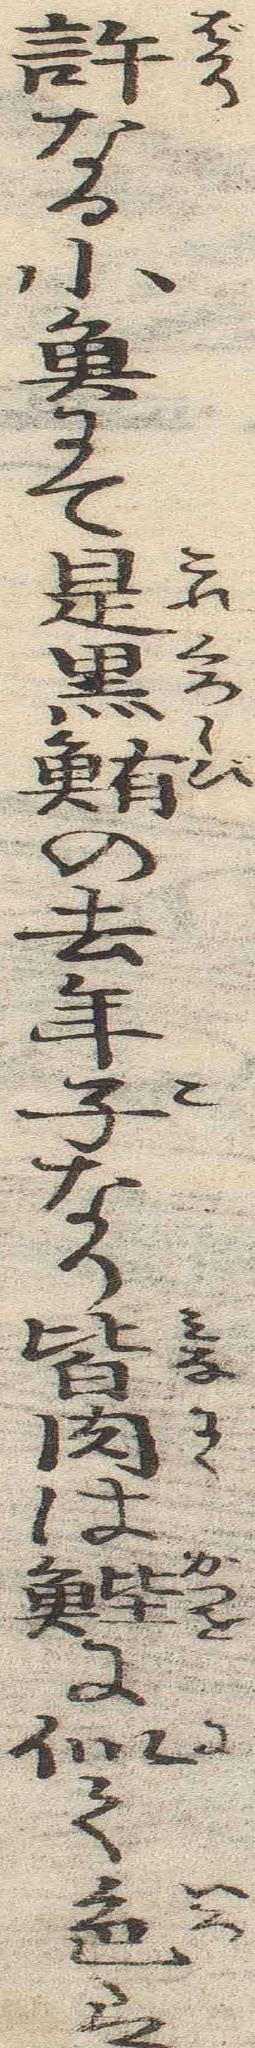許なる小魚にて是黒鮪の去年子なり皆肉は鰹に似て色は
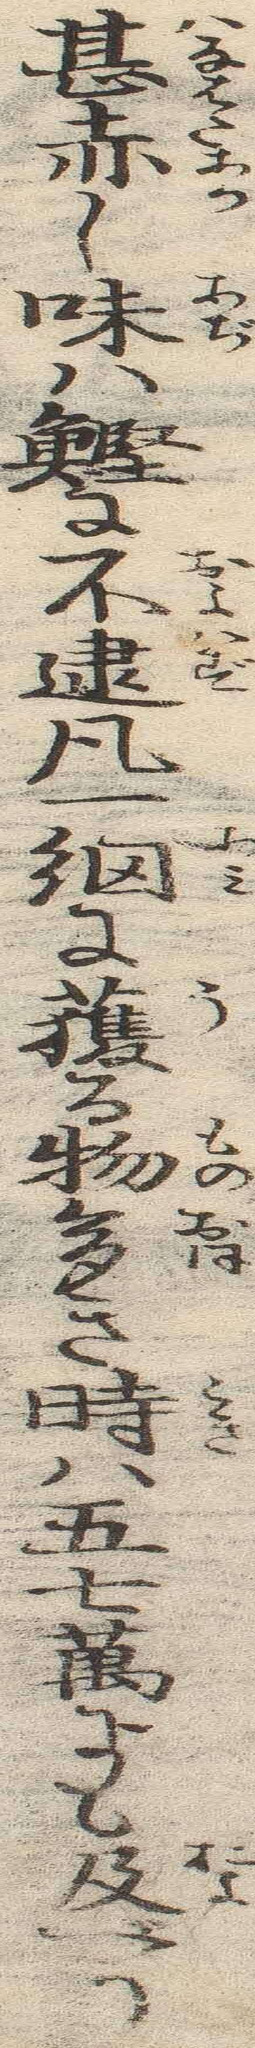甚赤し味は鰹に不逮凡一網に獲る物多き時は五七万にも及べり
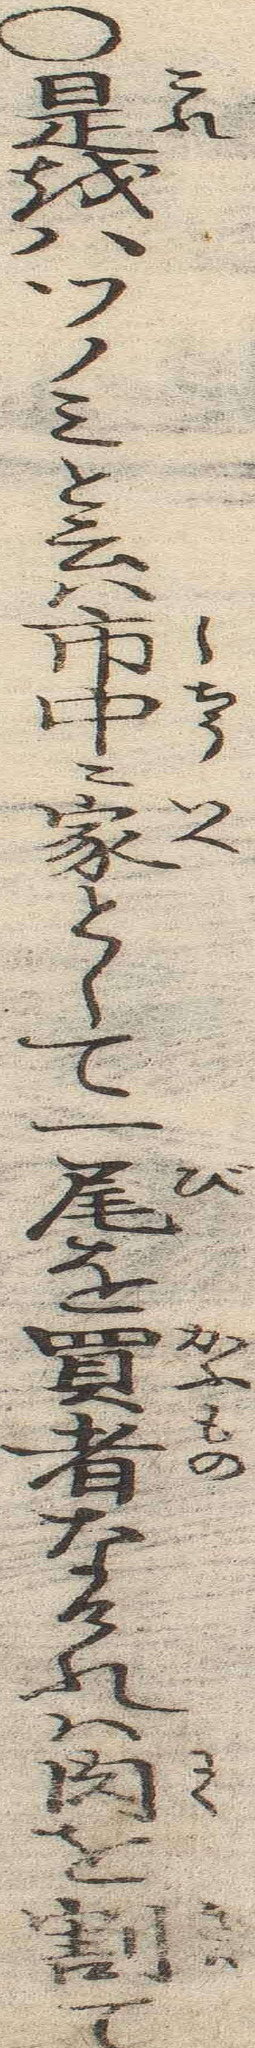○是をハツノミと云は市中に家として一尾を買者なけれは肉を割て
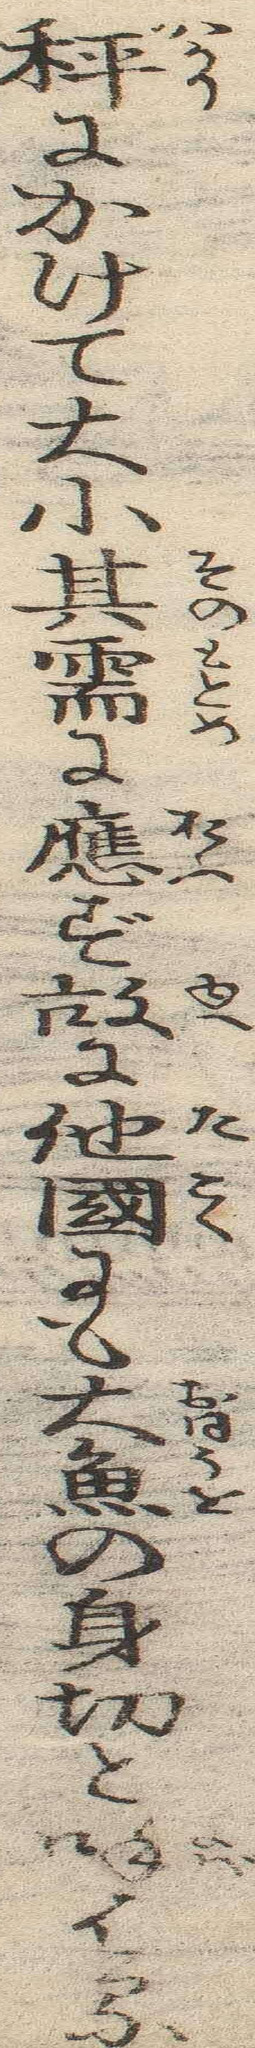秤にかけて大小其需に応ず故に他国にも大魚の身切と呼はる
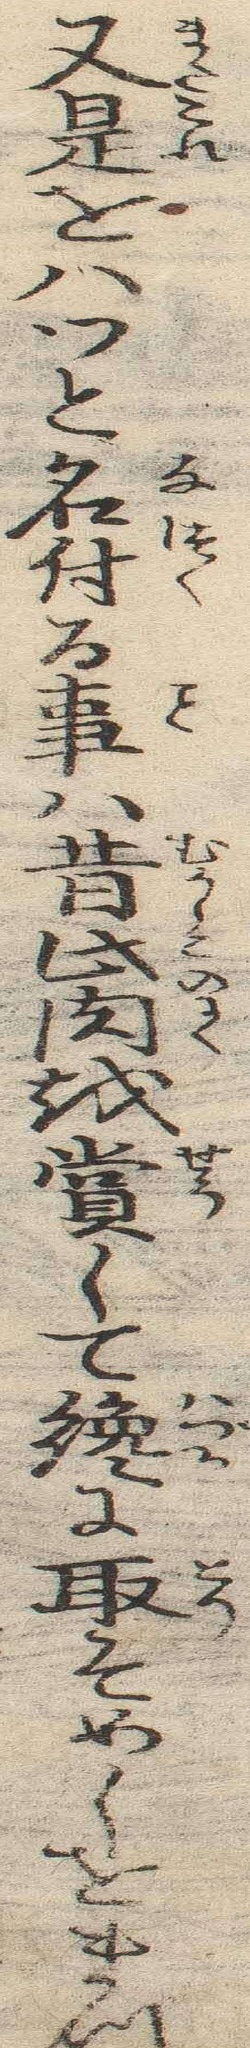又是をハツと名付る事は昔此肉を賞して纔に取そめしをまつ
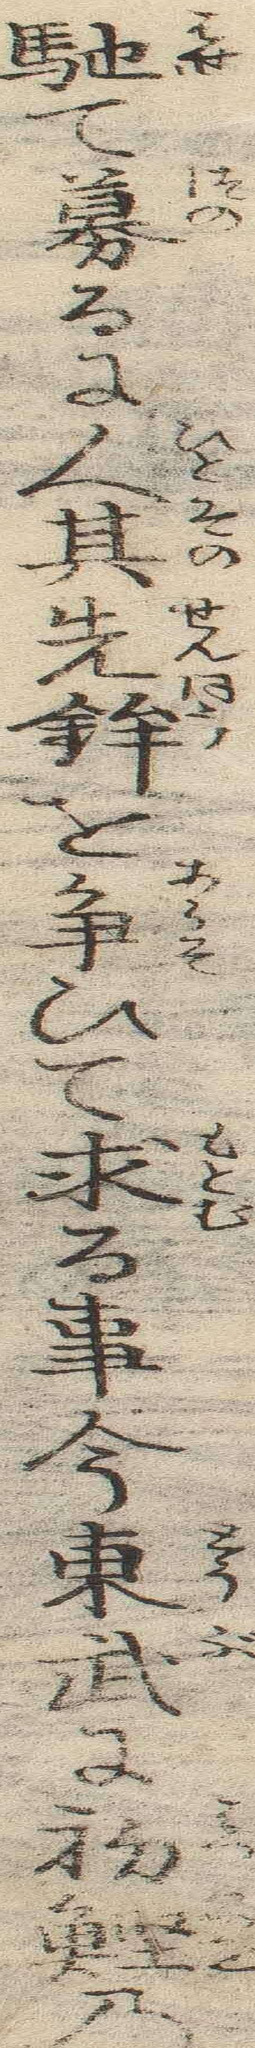馳て募るに人其先鋒を争ひて求る事今東武に初鰹の
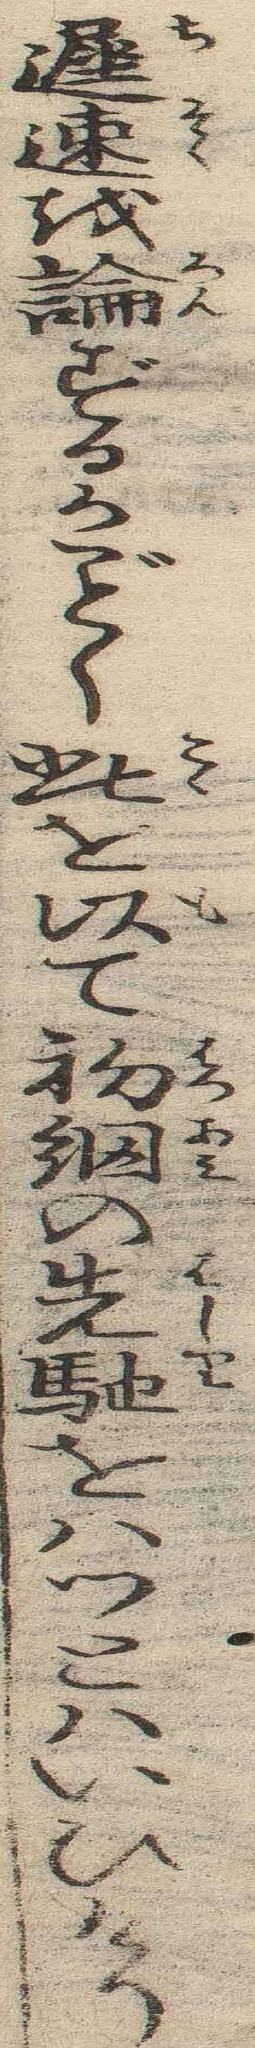遅速を論ずるかごとし此を以て初網の先馳をハツとはいひけり

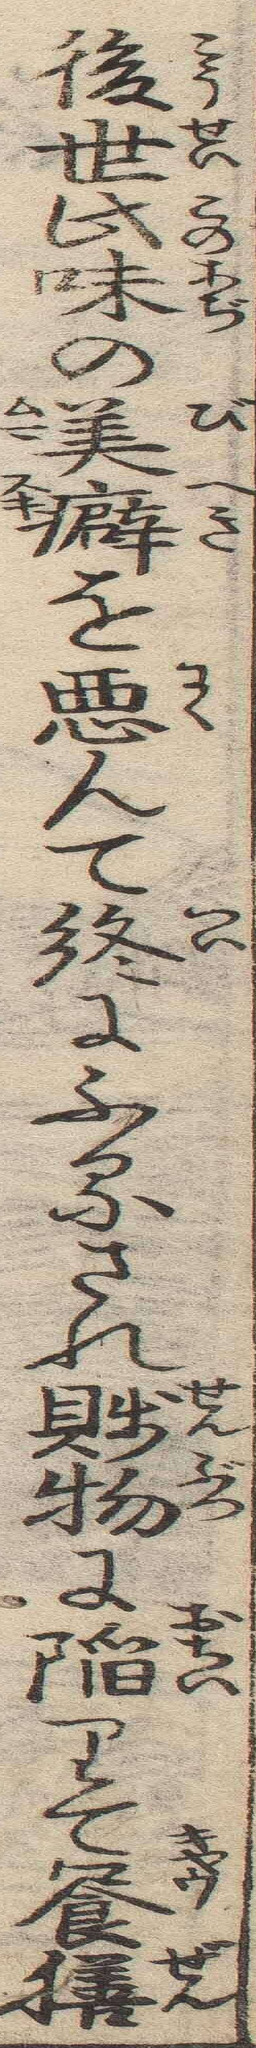後世此味の美癖を悪んて終にふるされ賤物に陥りて饗膳
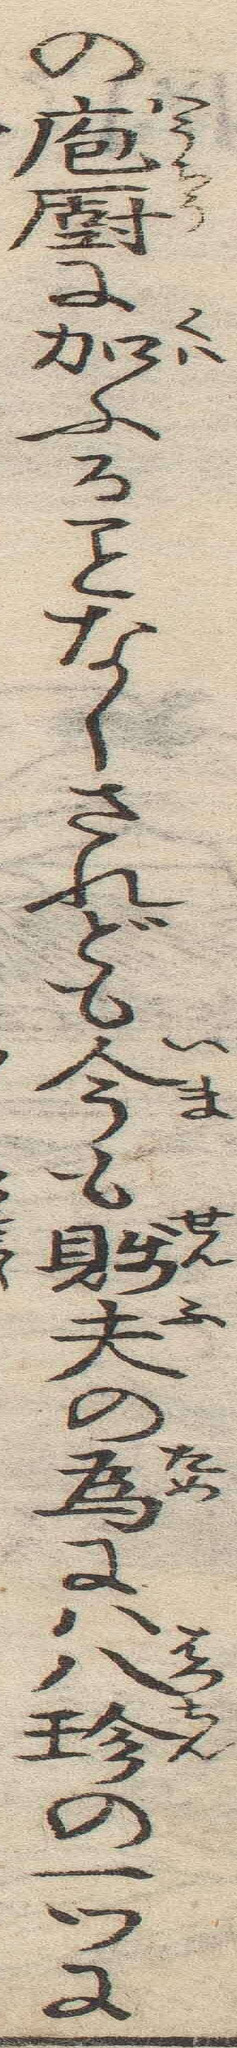の庖厨に加ふることなしされども今も賤夫の為には八珍の一ツに
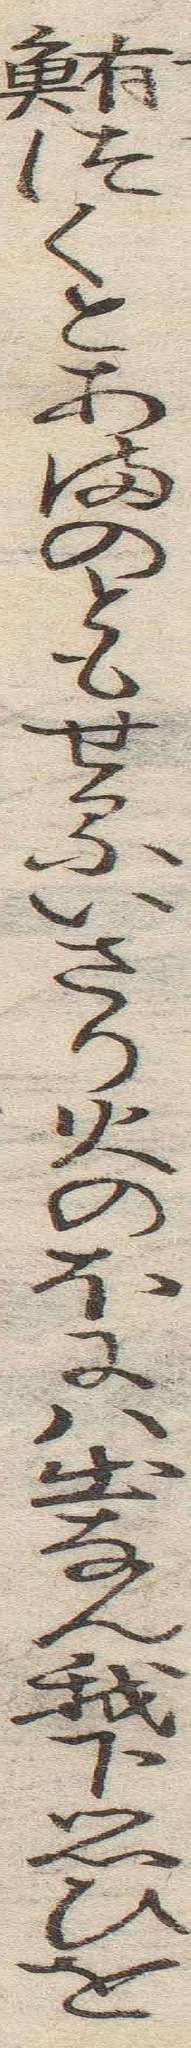鮪つくとあまのともせるいさり火のほには出なん我下思ひを
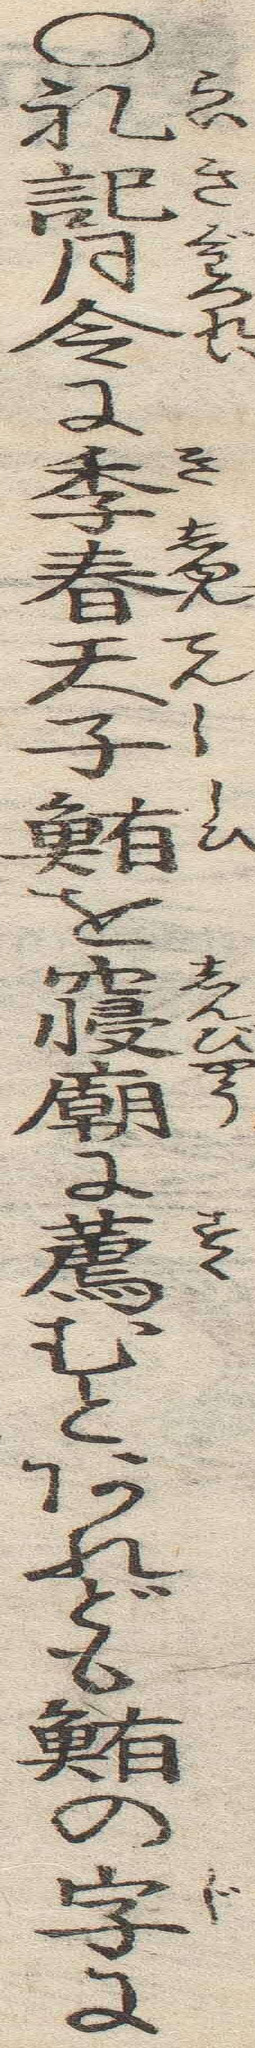○礼記月令に季春天子鮪を寝廟に薦むとあれども鮪の字に
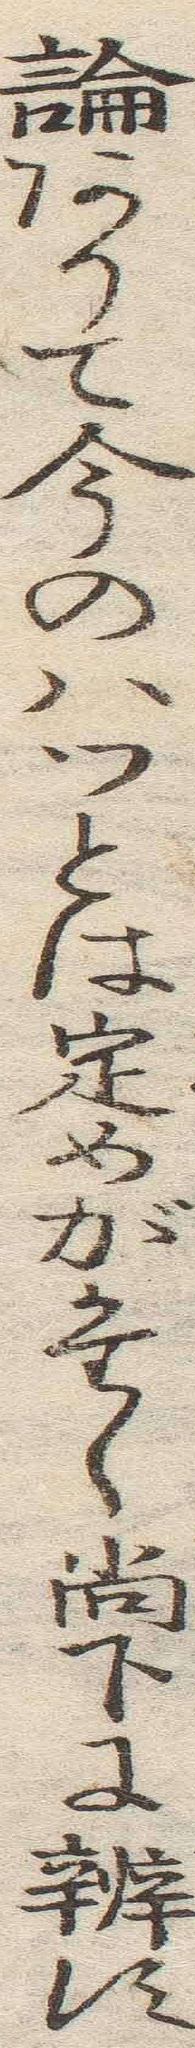論ありて今のハツとは定めがたし尚下に弁す
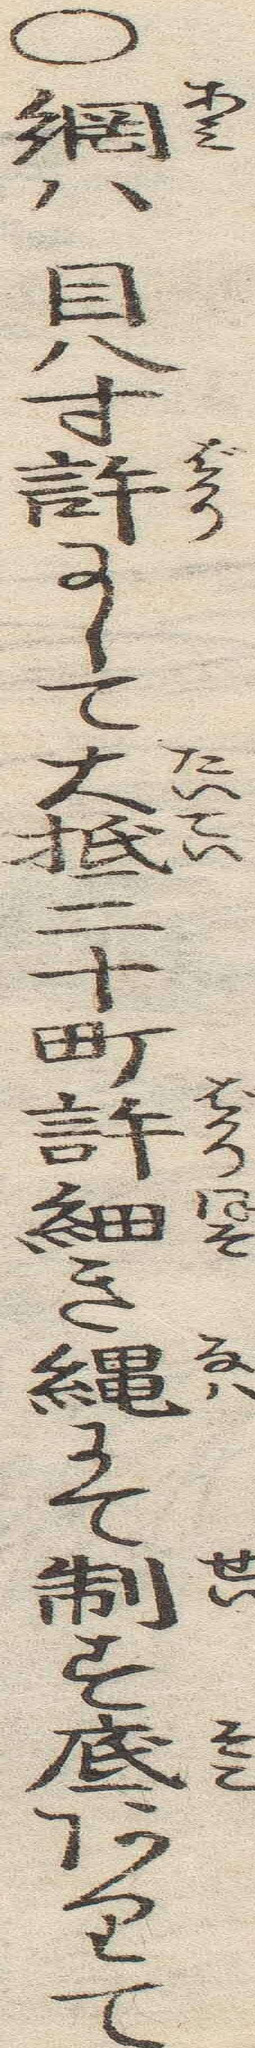○網は目八寸許にして大抵二十町許細き縄にて制す底ありて
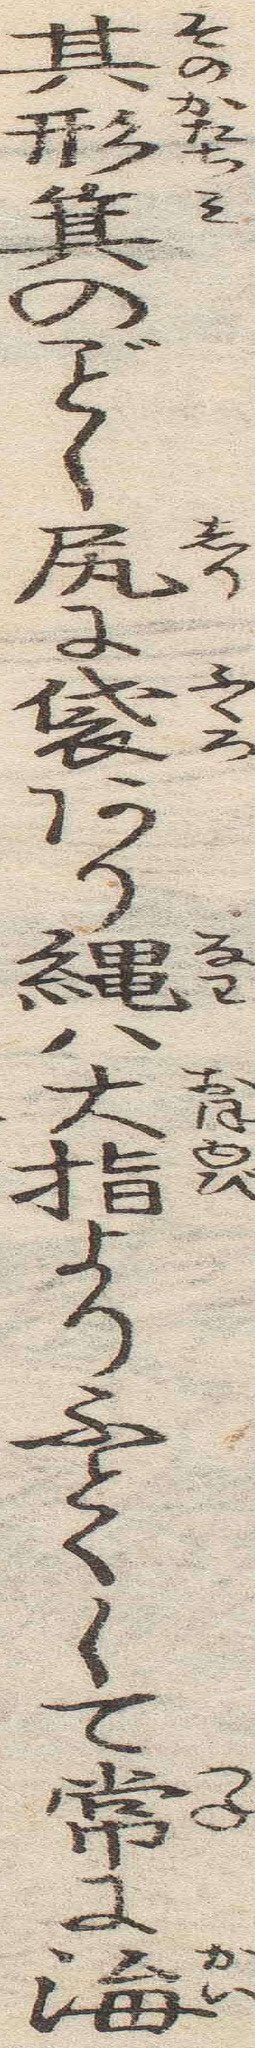其形箕のごとし尻に袋あり縄は大指よりふとくして常に海
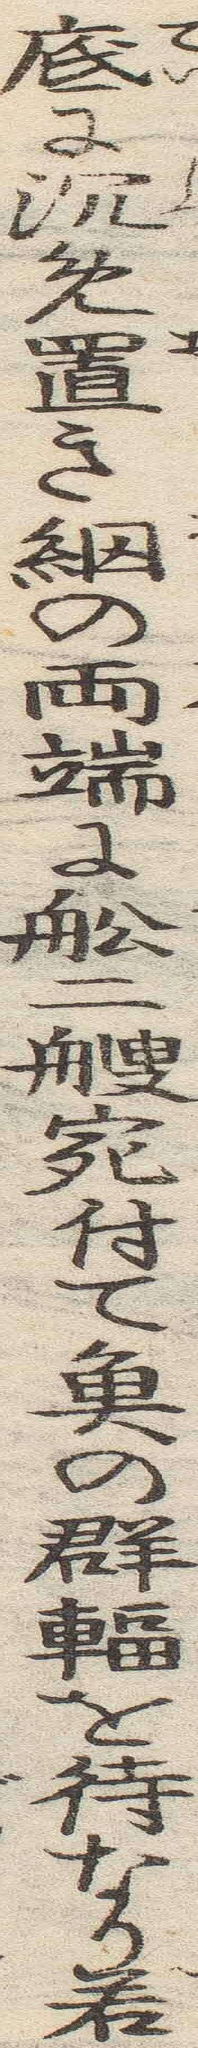底に沈め置き網の両端に船二艘宛付て魚の群輻を待なり若
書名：日本山海名産図会
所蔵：東京学芸大学附属図書館 国文学研究資料館
